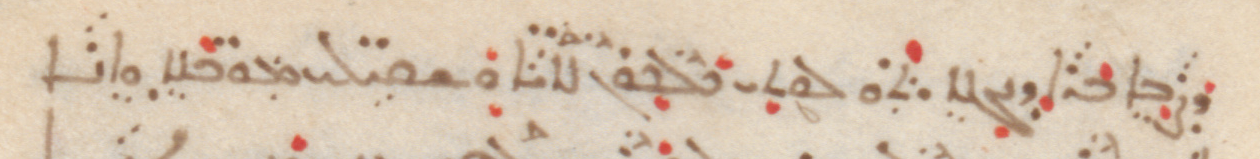ܕܨܒ̣ܐ ܒܪܐ ܕܢܓܠܐ. ܬܘ ܠܘܬܝ ܟܠܟܘܢ ܠܐܝ̈ܐ ܘܫܩܝ̈ܠܝ ܡܘܒ̈ܠܐ ܘܐܢܐ
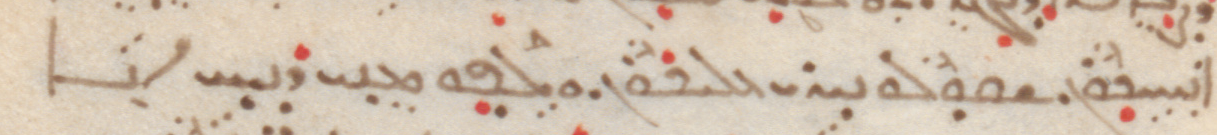ܐܢܝܚܟܘܢ: ܫܩܘܠܘ ܢܝܪܝ ܥܠܝܟܘܢ. ܘܝܠܦܘ ܡܢܝ ܕܢܝܚ ܐܢܐ
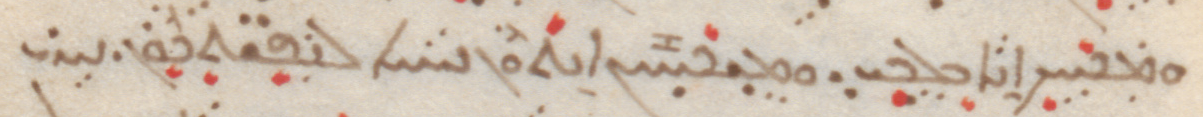ܘܡܟܝܟ ܐܢܐ ܒܠܒܝ܆ ܘܡܫܟܚܝܢ ܐܢܬܘܢ ܢܝܚܐ ܠܢܦܫ̈ܬܟܘܢ. ܢܝܪܝ
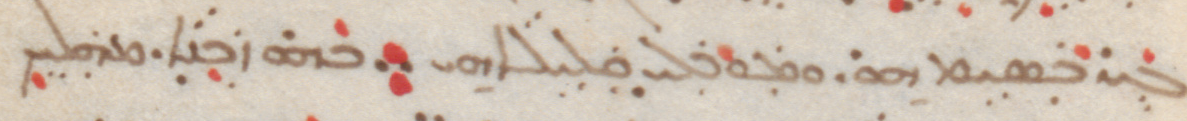ܓܝܪ ܒܣܝܡ ܗܘ܇ ܘܡܘܒܠܝ ܩܠܝܠܐܗܝ ܀ ܒܗ̇ܘ ܙܒܢܐ. ܡܗܠܟ
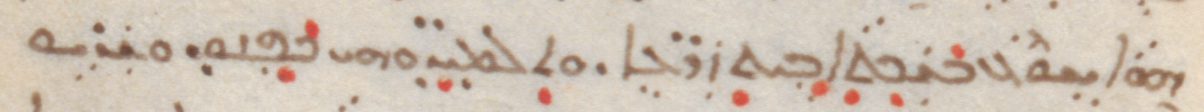ܗܘܐ ܝܫܘܥ ܒܫܒܬܐ ܒܝܬ ܙܪ̈ܥܐ. ܘܬܠܡܝ̈ܕܘܗܝ ܟܦܢܘ܆ ܘܫܪܝܘ
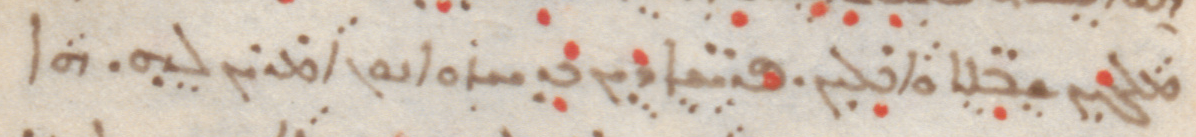ܡܠܓܝܢ ܫܒ̈ܠܐ ܘܐ̇ܟܠܝܢ. ܦܪ̈ܝܫܐ ܕܝܢ ܟܕ ܚܙܘ ܐܢܘܢ ܐܡ̇ܪܝܢ ܠܗ. ܗܐ
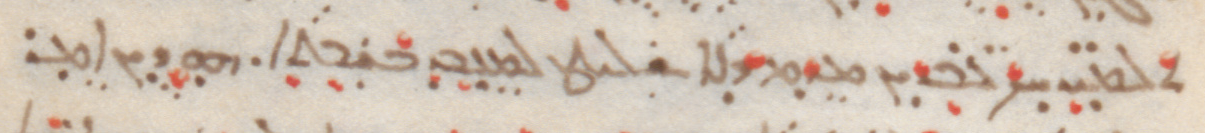ܬܠܡܝ̈ܕܝܟ ܥ̇ܒܕܝܢ ܡܕܡ ܕܠܐ ܫܠܝܛ ܠܡܥ̣ܒܕ ܒܫܒܬܐ. ܗ̣ܘ ܕܝܢ ܐܡ̣ܪ
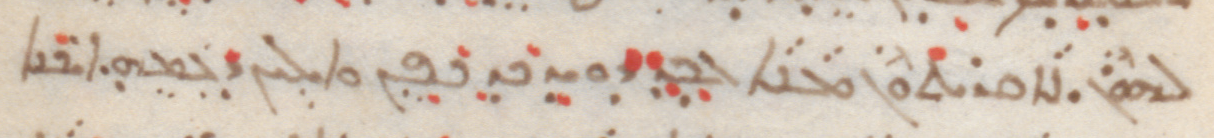ܠܗܘܢ. ܠܐ ܩܪܝܬܘܢ ܡܢܐ ܥܒ̣ܕ ܕܘܝܕ ܟܕ ܟܦܢ ܘܐܝܠܝܢ ܕܥܡܗ ܐܝܟܢܐ
